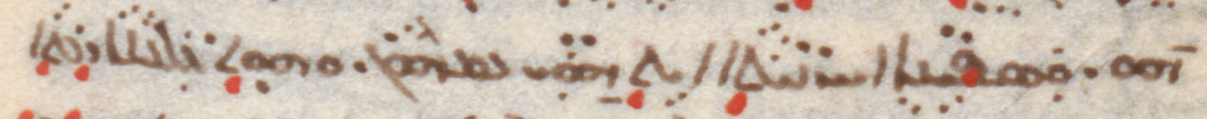ܗܘ. ܘܣܦܝ̈ܢܐ ܐܚܪ̈ܢܝܬܐ ܐܝܬ ܗܘ̈ܝ ܥܡܗܘܢ. ܘܗܘܬ ܥ̈ܠܥܢܐ ܪܒܬܐ
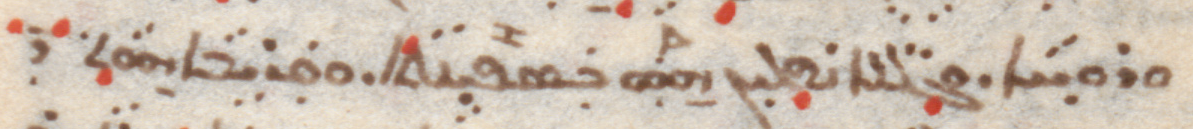ܘܪܘܚܐ. ܘܓܠ̈ܠܐ ܢ̇ܦܠܝܢ ܗܘܘ ܒܣܦܝܢܬܐ. ܘܩܪܝܒܐ ܗܘܬ ܏ܕ
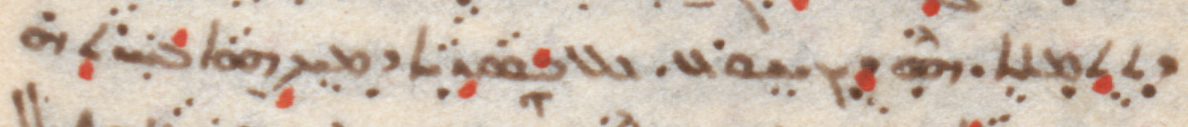ܕܬܬܡܠܐ. ܗ̣ܘ ܕܝܢ ܝܫܘܥ. ܥܠ ܒܣܕܝܐ ܕܡܝܟ ܗܘܐ ܒܚܪܬܗ̇
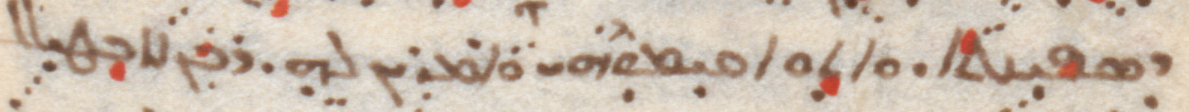ܕܣܦܝܢܬܐ. ܘܐܬ̣ܘ ܐܩܝܡܘܗܝ ܘܐܡ̇ܪܝܢ ܠܗ. ܪܒܢ ܠܐ ܒܛܝܠ
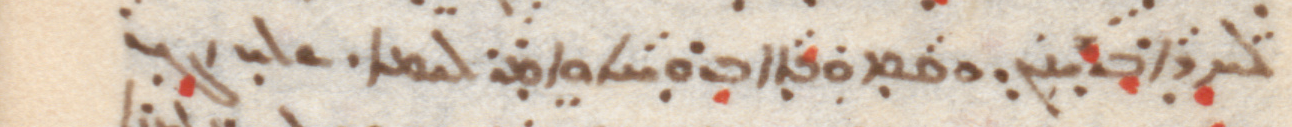ܠܟ ܕܐܒܕܝܢܢ܆ ܘܩܡ ܘܟܐܐ ܒܪܘܚܐ ܘܐܡ̣ܪ ܠܝܡܐ. ܫܠܝ ܙܓܝܪ
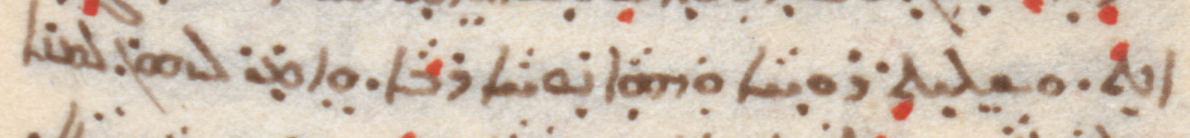ܐܢܬ. ܘܫܠܝܬ ܪܘܚܐ ܘܗܘ̣ܐ ܢܘܚܐ ܪܒܐ. ܘܐܡ̣ܪ ܠܗܘܢ܆ ܠܡܢܐ
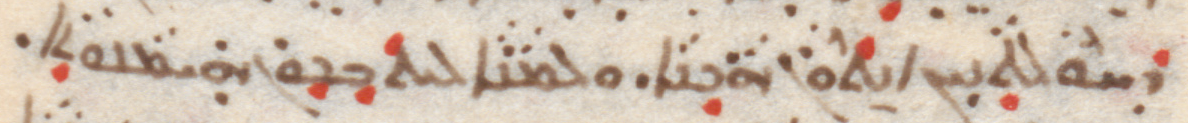ܕܚܘܠܬܢܝܢ ܐܢܬܘܢ ܗܟܢܐ. ܘܠܡܢܐ ܠܝܬ ܒܟܘܢ ܗܝܡܢܘܬܐ.
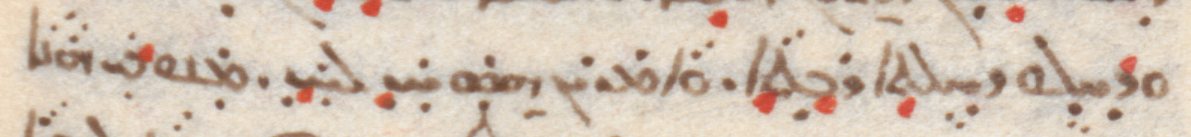ܘܕܚܠܘ ܕܚܠܬܐ ܪܒܬܐ. ܘܐܡ̇ܪܝܢ ܗܘܘ ܚܕ ܠܚܕ. ܡܢܘ ܟܝ ܗܢܐ
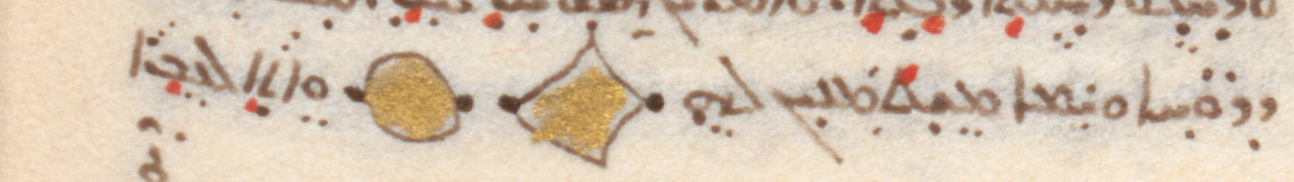ܕܪ̈ܘܚܐ ܘܝܡܐ ܡܫܬܡܥܝܢ ܠܗ ܀ ܀ ܘܐܬ̣ܐ ܠܥܒܪܐ
